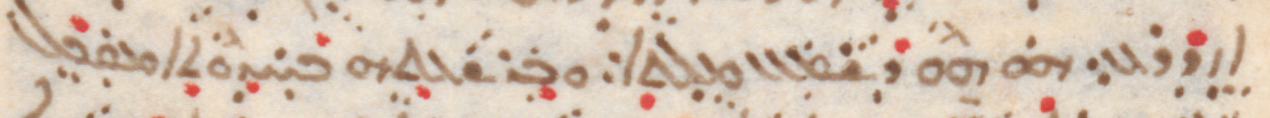ܐܙܕܪܥ܆ ܗ̇ܘ ܗܘ ܕܫ̇ܡܥ ܡܠܬܐ: ܘܒܪܫܥܬܗ ܒܚܕܘܬܐ ܡܩܒܠ
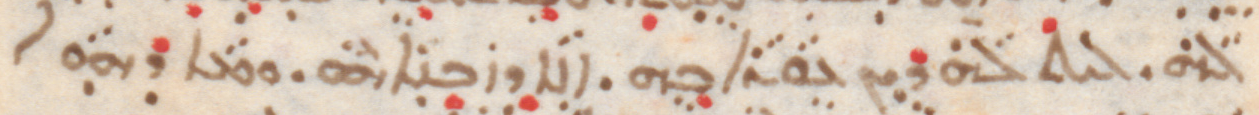ܠܗ̇. ܠܝܬ ܠܗ̇ ܪܝܢ ܥܘܪܐ ܒܗ. ܐܢܐ ܕܙܒܢܐ ܗ̇ܘ. ܘܡܐ ܕܗܘ̣ܐ
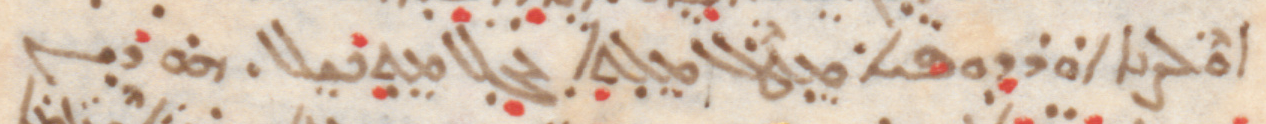ܐܘܠܨܢܐ ܐܘܪܕܘܦܝܐ ܡܛܠ ܡܠܬܐ ܥܓ̣ܠ ܡܬܟܫܠ. ܗ̇ܘ ܕܝܢ
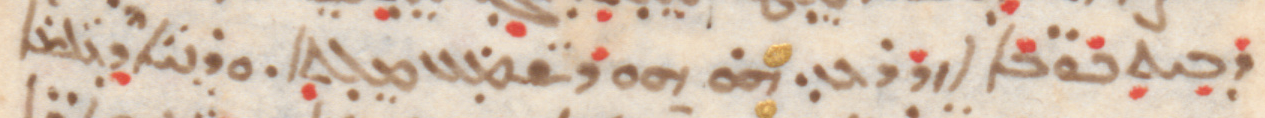ܕܒܝܬ ܟܘ̈ܒܐ ܐܙܕܪܥ܆ ܗ̇ܘ ܗܘ ܕܫܡ̣ܥ ܡܠܬܐ. ܘܪܢܝܐ ܕܥܠܡܐ
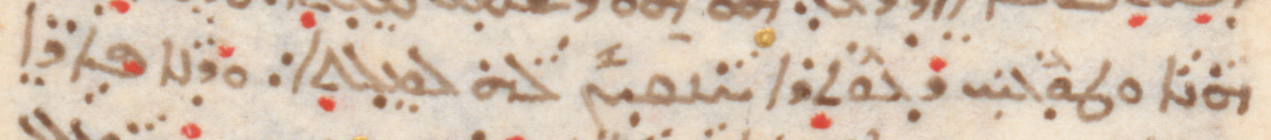ܗܢܐ ܘܛܘܥܚ ܕܥܘܬܪܐ ܚ̇ܢܩܝܢ ܠܗ̇ ܠܡܠܬܐ: ܘܕܠܐ ܦܐܪ̈ܐ
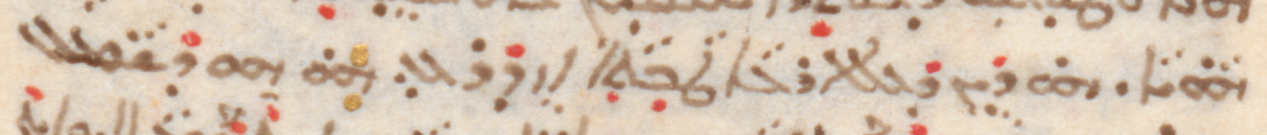ܗܘ̇ܝܐ. ܗ̇ܘ ܕܝܢ ܕܥܠ ܐܪܥܐ ܛܒܬܐ ܐܙܕܪܥ܆ ܗ̇ܘ ܗܘ ܕܫ̇ܡܥ
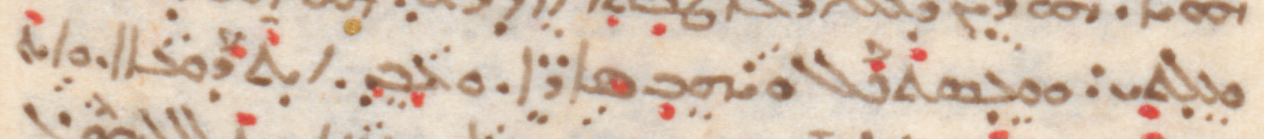ܡܠܬܝ: ܘܡܣܬܟܠ ܘܝ̇ܗܒ ܦܐܪ̈ܐ. ܘܥܒܕ. ܐܝܬ ܕܡܐܐ. ܘܐܝܬ
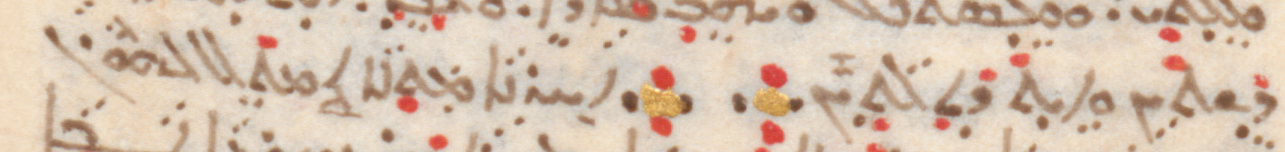ܕܫܬܝܢ ܘܐܝܬ ܕܬܠܬܝܢ ܀ ܀ ܐܚܪܢܐ ܡܬܠܐ ܐܡܬܠ ܠܗܘܢ
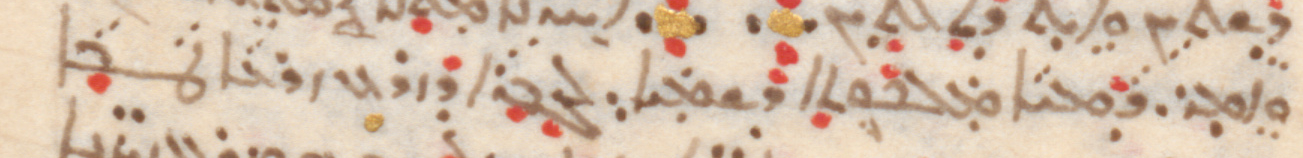ܘܐܡ̣ܪ. ܕܡܝܐ ܡܠܟܘܬܐ ܕܫܡܝܐ܆ ܠܓܒܪܐ ܕܙܪܥ ܙܪܥܐ ܛܒܐ
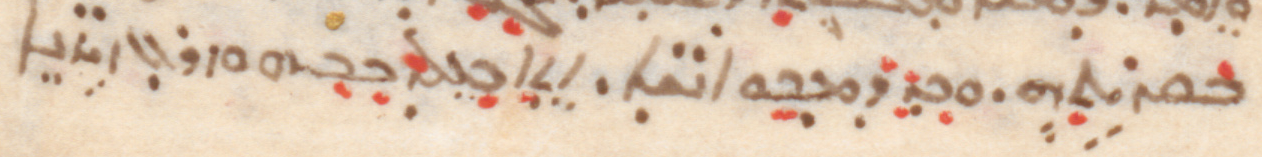ܒܩܪܝܬܗ. ܘܟܕ ܕܡܟܘ ܐܢ̈ܫܐ܆ ܐܬܐ ܒܥܠܕܒܒܗ ܘܙܪܥ ܙܝܙ̈ܢܐ
